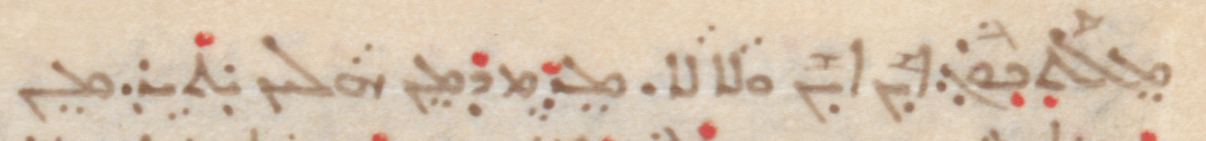ܡܠܬܟܘܢ ܐܝܢ ܐܝܢ ܘܠܐ ܠܐ ܡܕܡ ܕܡܢ ܗܠܝܢ ܝܬܝܪ܆ ܡܢ
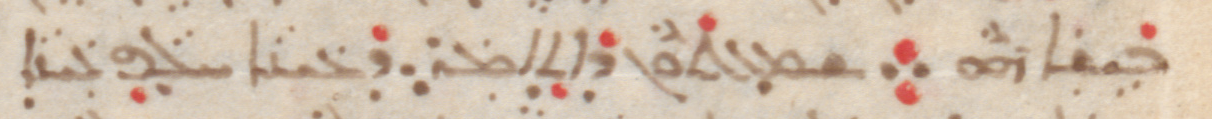ܒܝܫܐ ܗܘ܀ ܫܡܥܬܘܢ ܕܐܬܐܡܪ܆ ܕܥܝܢܐ ܚܠܦ ܥܝܢܐ
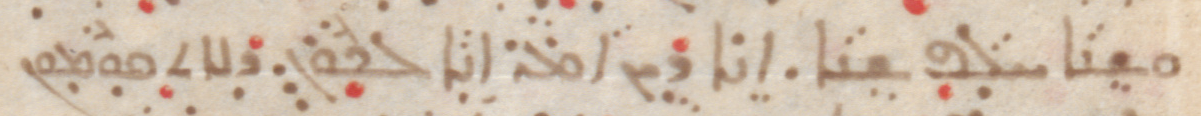ܘܫܢܐ ܠܦ ܫܢܐ. ܐܢܐ ܕܝܢ ܐܡ̇ܪ ܐܢܐ ܠܟܘܢ܆ ܕܠܐ ܬܩܘܡܘܢ
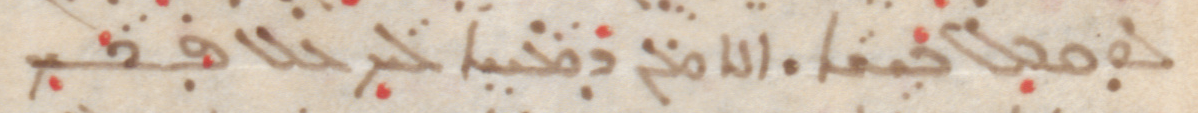ܠܘܩܒܠ ܒܝܫܐ. ܐܠܐ ܡ̇ܢ ܕܡ̇ܚܐ ܠܟ ܥܠ ܦܟܟ
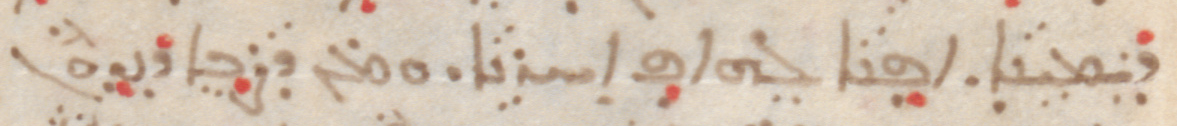ܕܝܡܝܢܐ܆ ܐܦܢܐ ܠܗ ܐܦ ܐܚܪܢܐ. ܘܡ̇ܢ ܕܨ̇ܒܐ ܕܢܕܘܢ
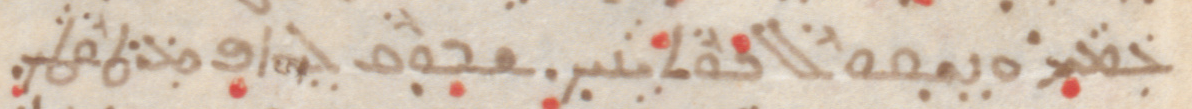ܥܡܟ ܘܢܫܩܘܠ ܟܘܬܝܢܟ. ܫܒܘܩ ܠܗ ܐܦ ܡܪܛܘܛܟ.
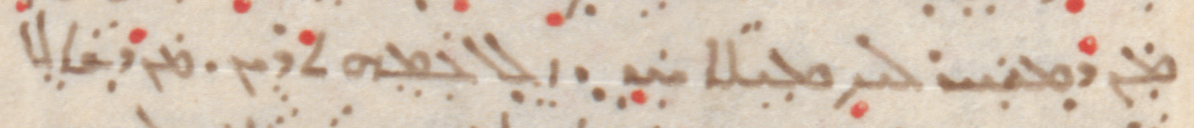ܡܢ ܕܡܫܚܪ ܠܟ ܡܝܠܐ ܚܕ܆ ܙܠ̣ ܥܡܗ ܬܪܝܢ. ܡܢ ܕܫܐܠ
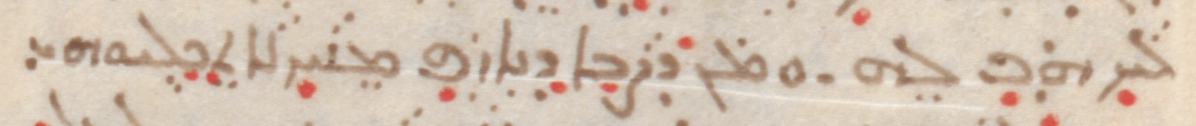ܠܟ ܗܒ ܠܗ ܘܡ̇ܢ ܕܨܒܐ ܕܢܐܙܦ ܡܢܟ ܠܐ ܬܟܠܝܘܗܝ
